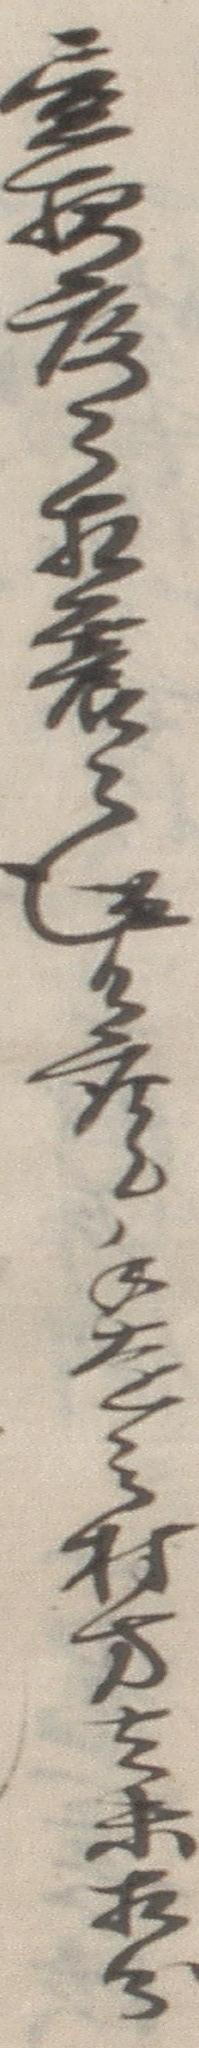昼夜度々相震候趣御座候手遠之村方は未相分
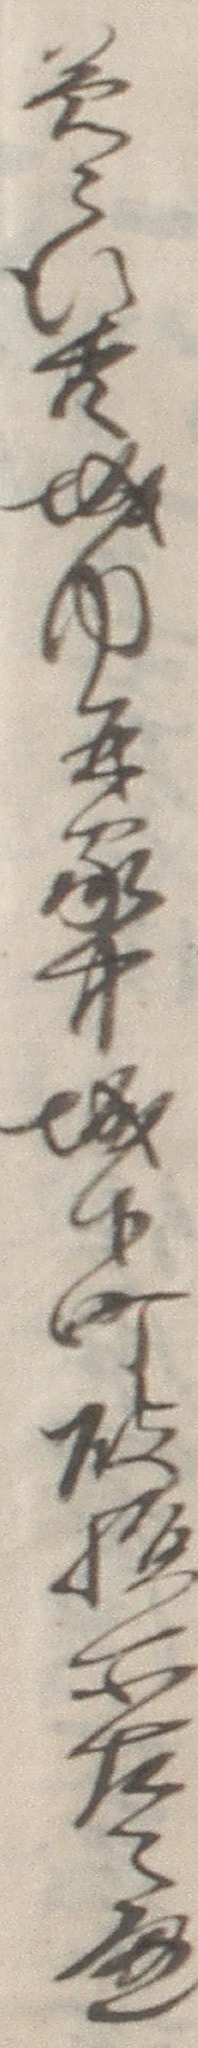兼候得共城内并家中城下町破損所左之通
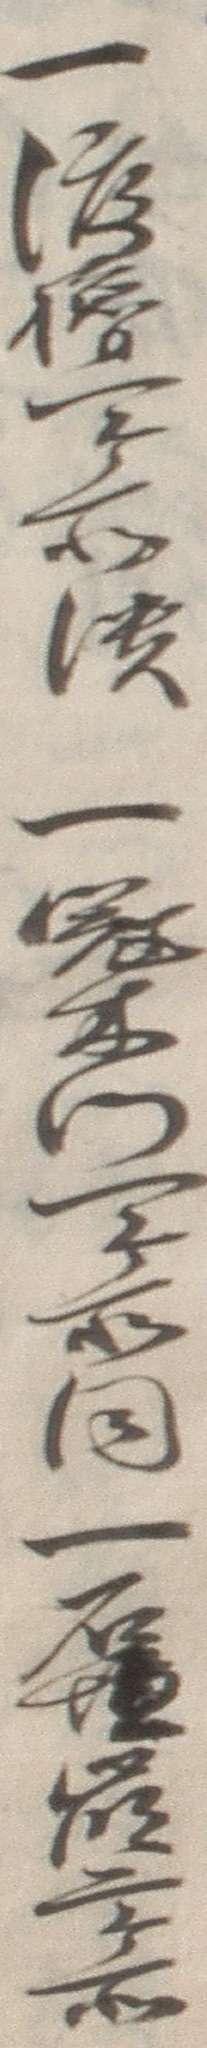一渡櫓一ヶ所潰一冠木門一ヶ所同一石垣崩二ヶ所
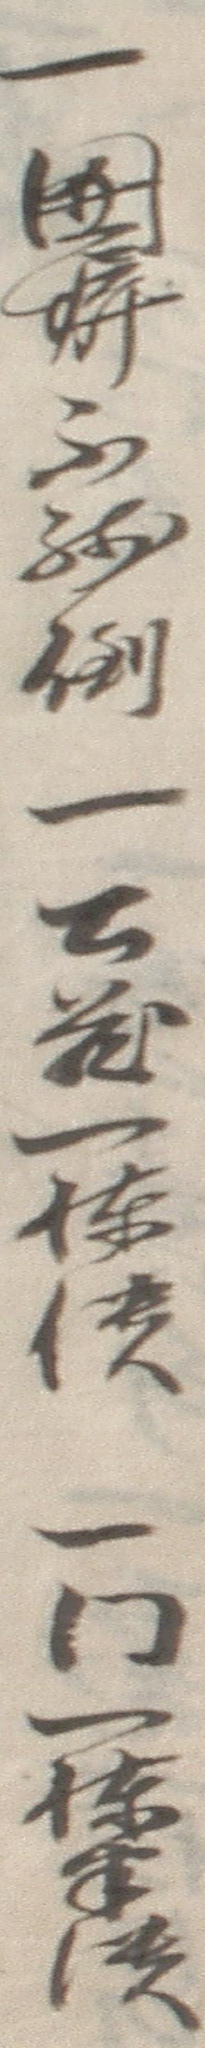一囲塀不残倒一土蔵一棟潰一同一棟半潰
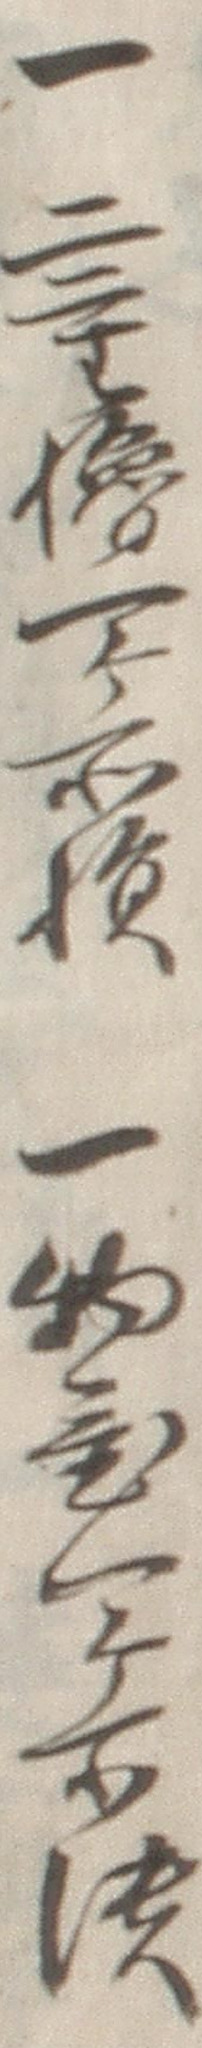一二重櫓一ヶ所損一物置一ヶ所潰
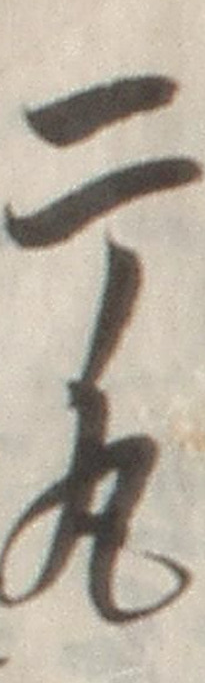二ノ丸
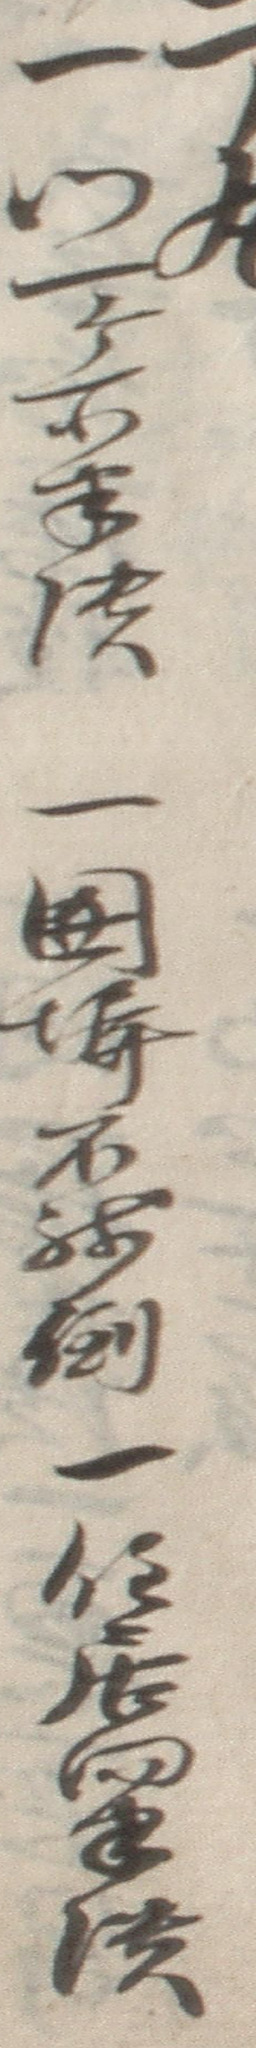一門一ヶ所半潰一囲塀不残倒一住居向半潰
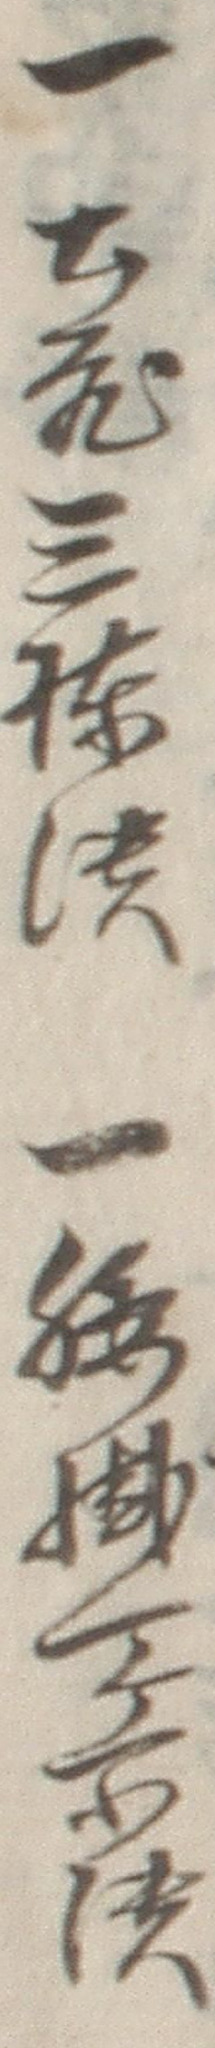一土蔵三棟潰一腰掛一ヶ所潰

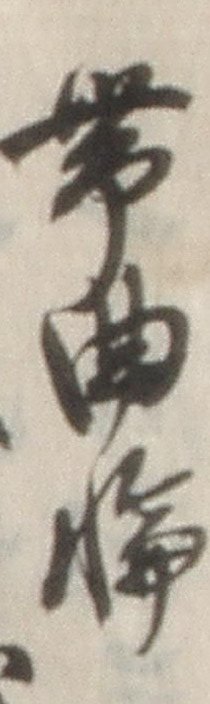帯曲輪
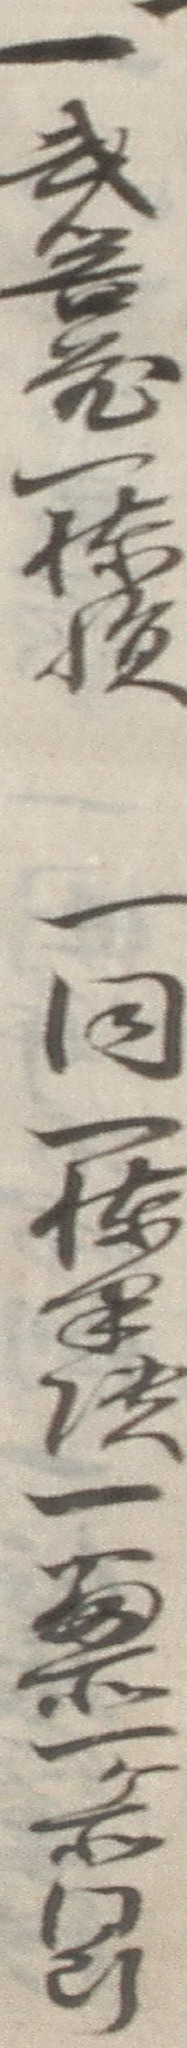一武器蔵一棟損一同一棟半潰一番所一ヶ所同断
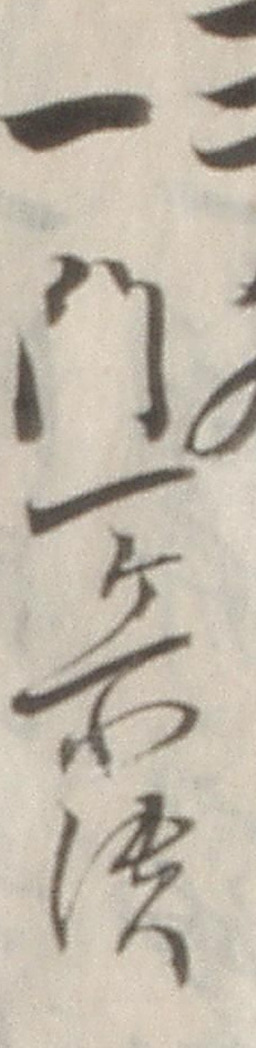一番所一ヶ所潰
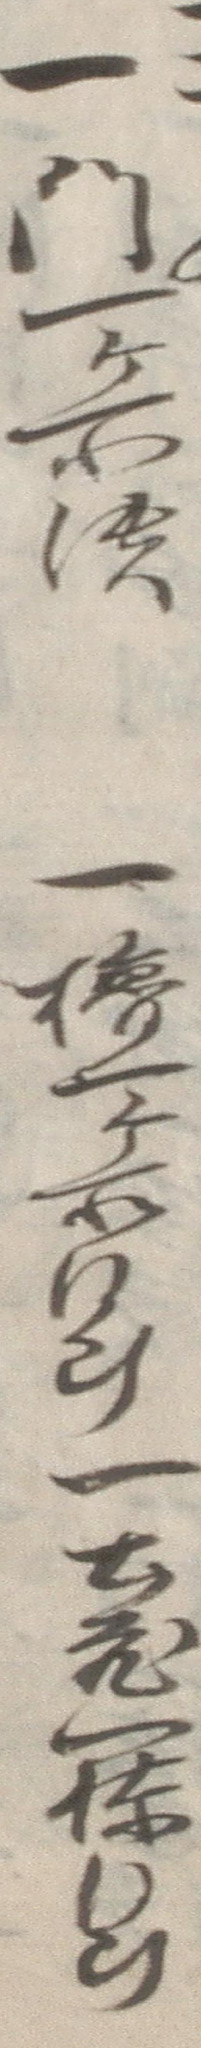一門一ヶ所潰一櫓一ヶ所同断一土蔵一棟同断
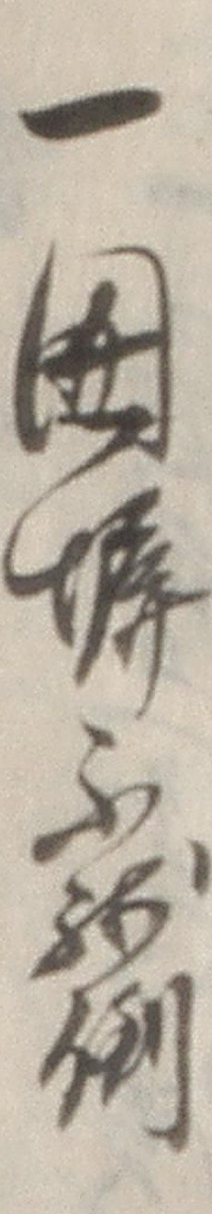一囲塀不残倒
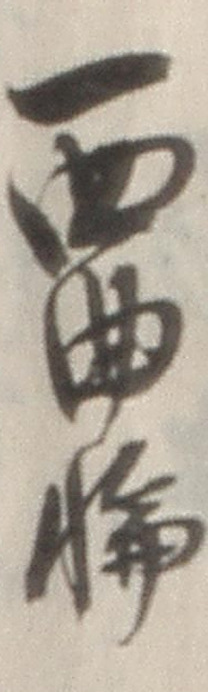西曲輪
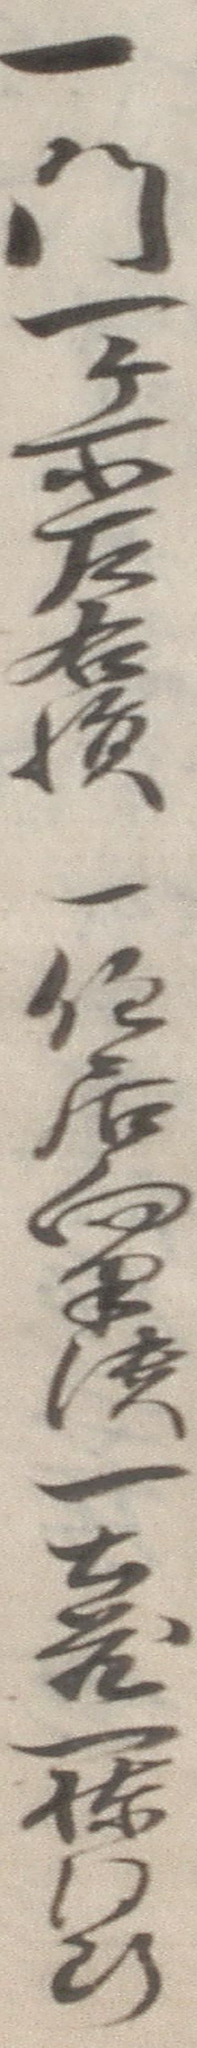一門一ヶ所左右損一住居向半潰一土蔵一棟同断
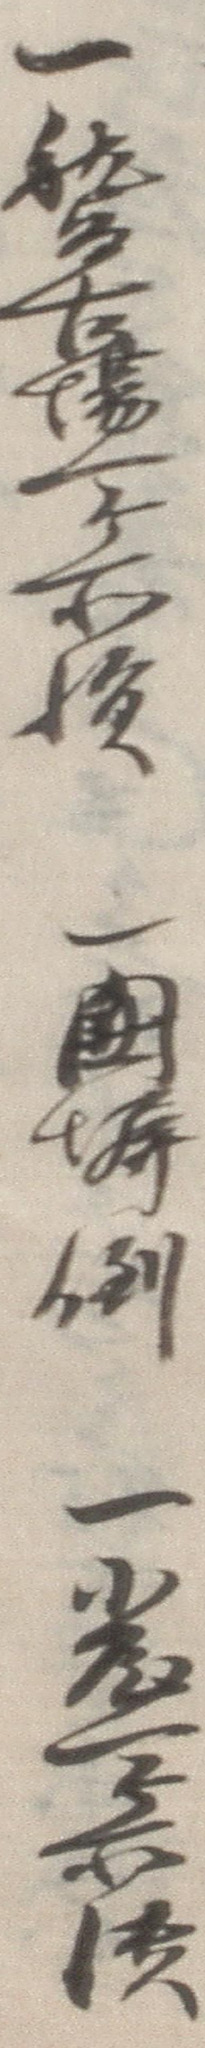一稽古場一ヶ所損一囲塀倒一小屋一ヶ所潰
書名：信州地震一件
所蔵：東京大学地震研究所図書室 Earthquake Research Institute Library, The University of Tokyo, JAPAN
